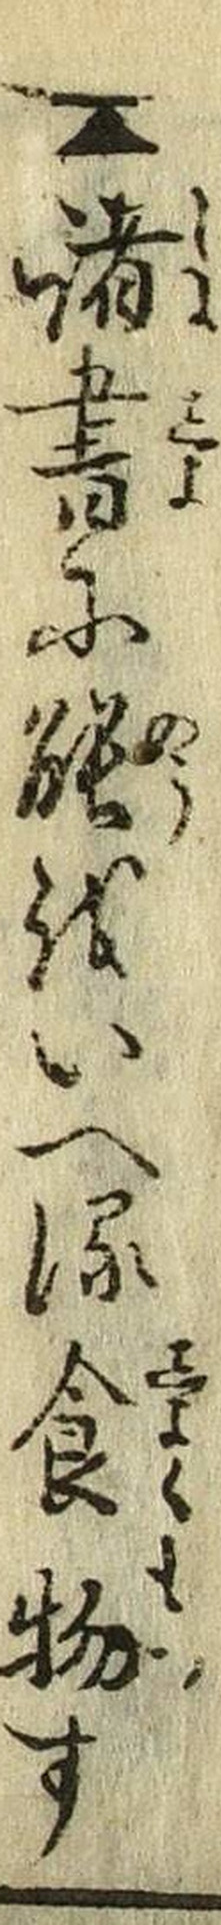▲諸書に能をいへる食物す
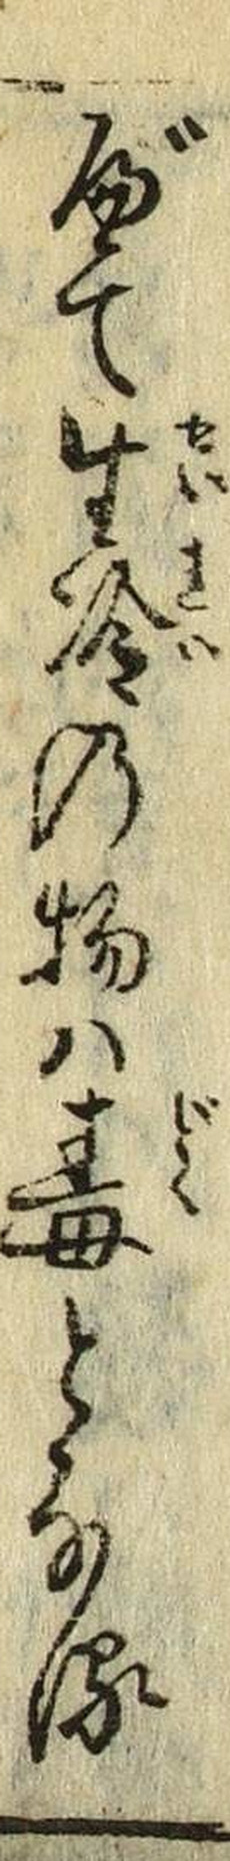べて生冷の物は毒となる
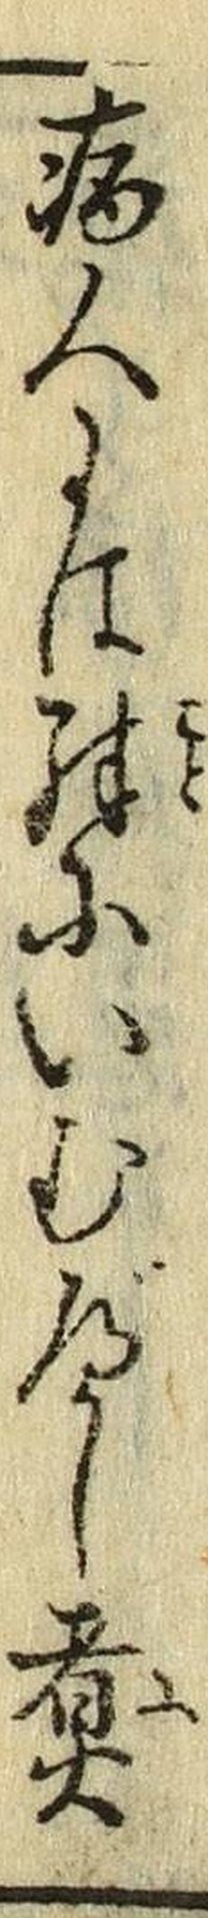病人には殊にいむべし煮
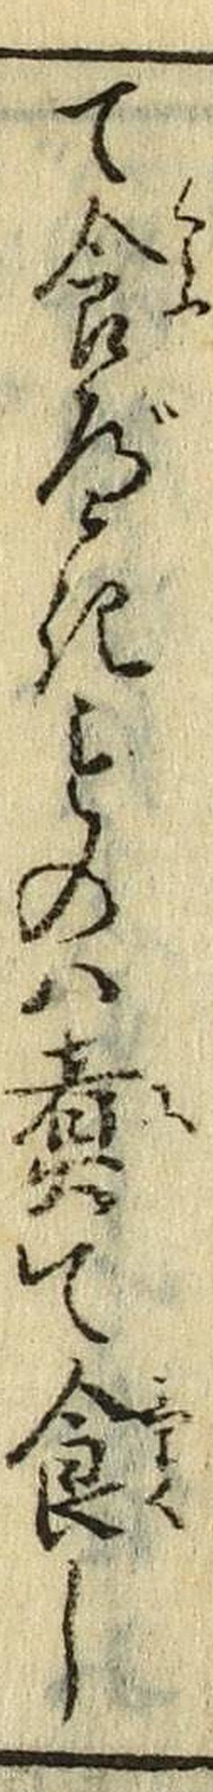て食べきものは煮て食し
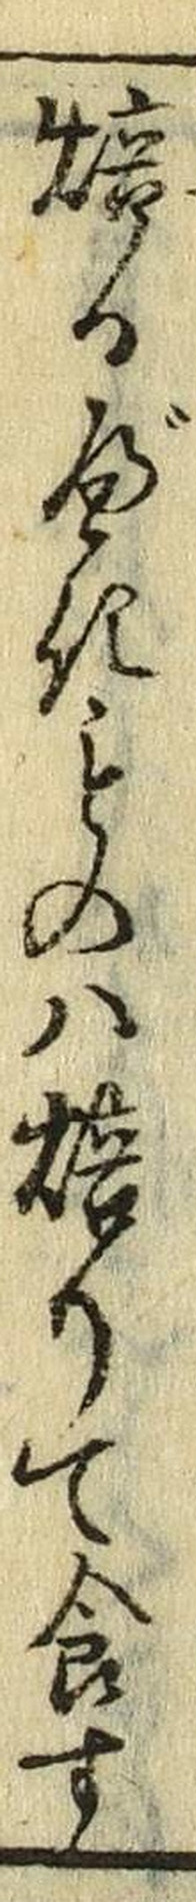焙るべきものは焙りて食す
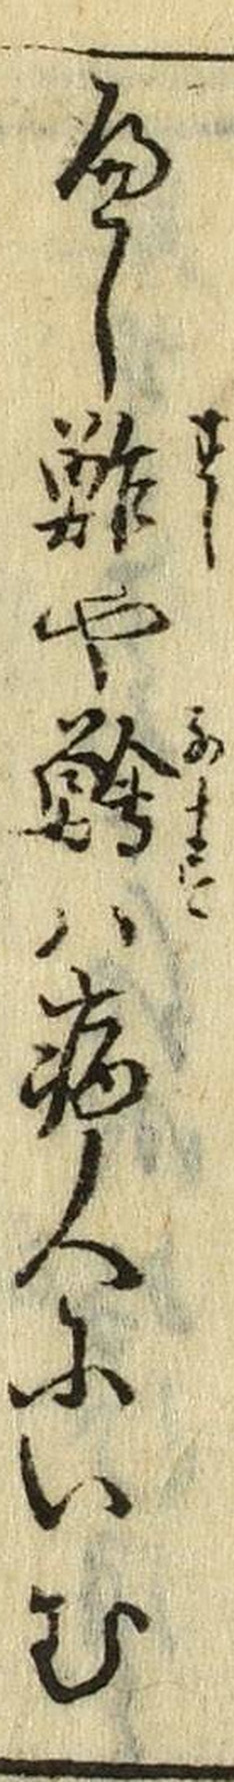へし鮓や鱠は病人にいむ
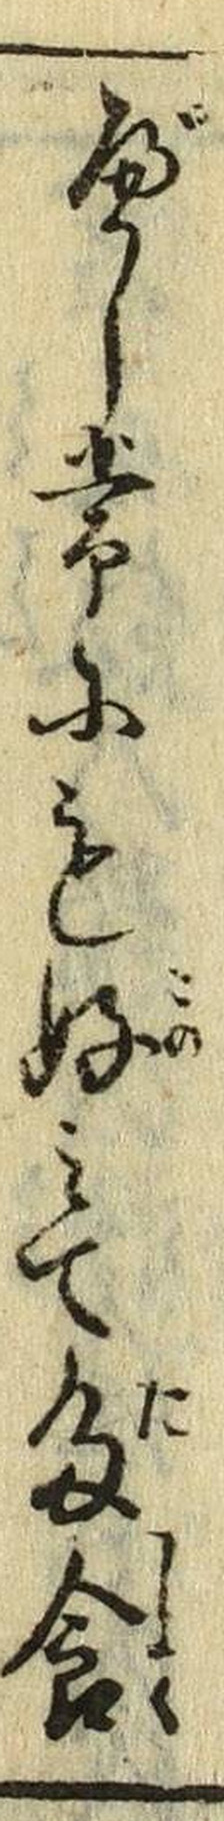べし常にも好みて多食
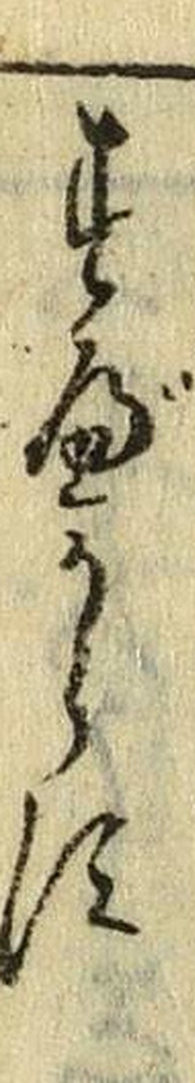すべからす
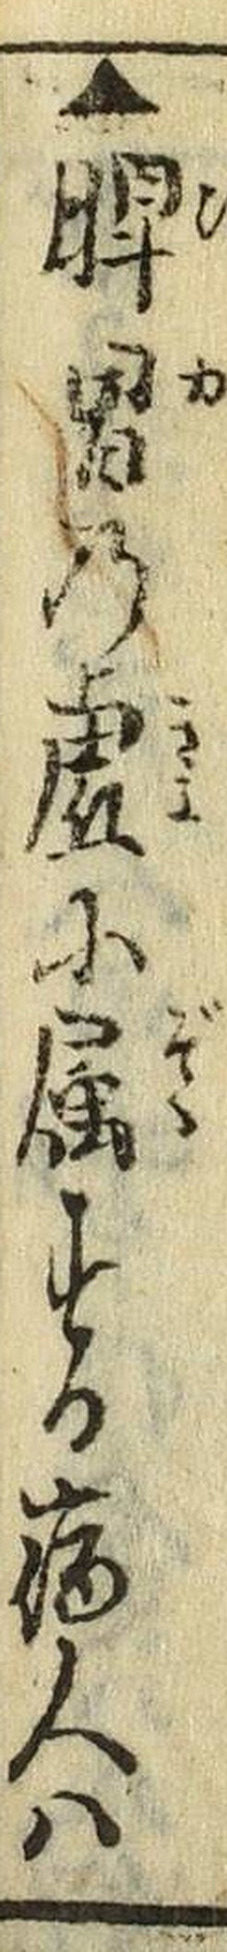▲脾胃の虚に属する病人は
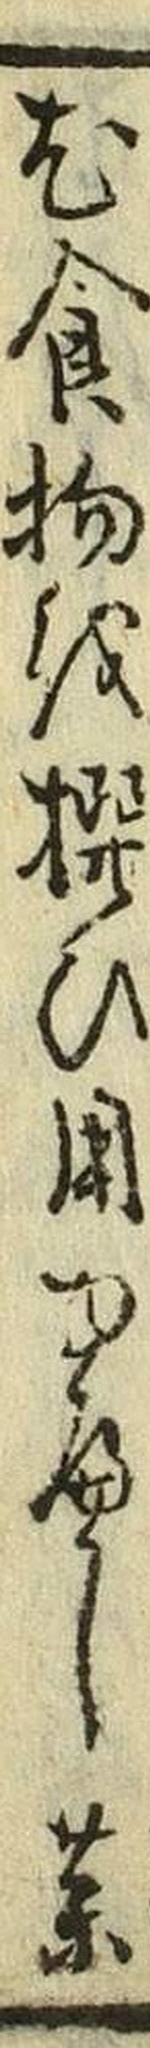尤食物を撰ひ用ゆへし薬
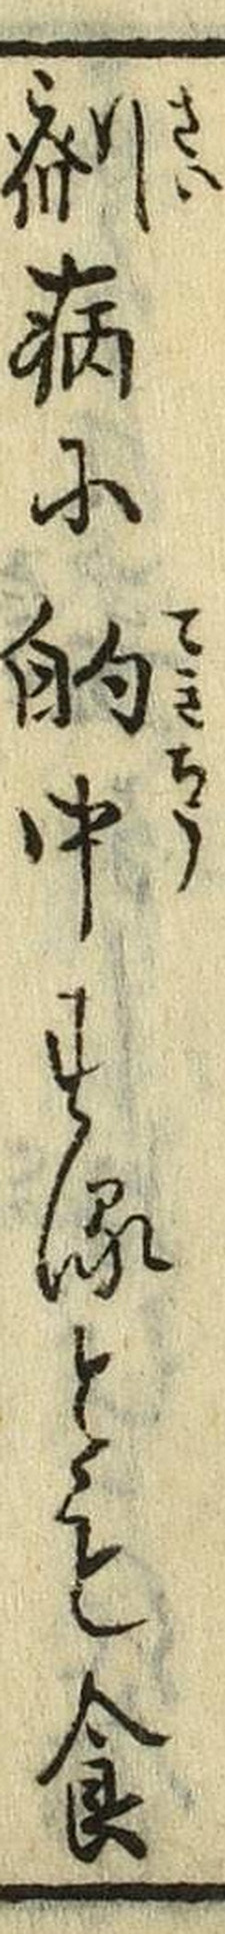剤病に的中するとも食
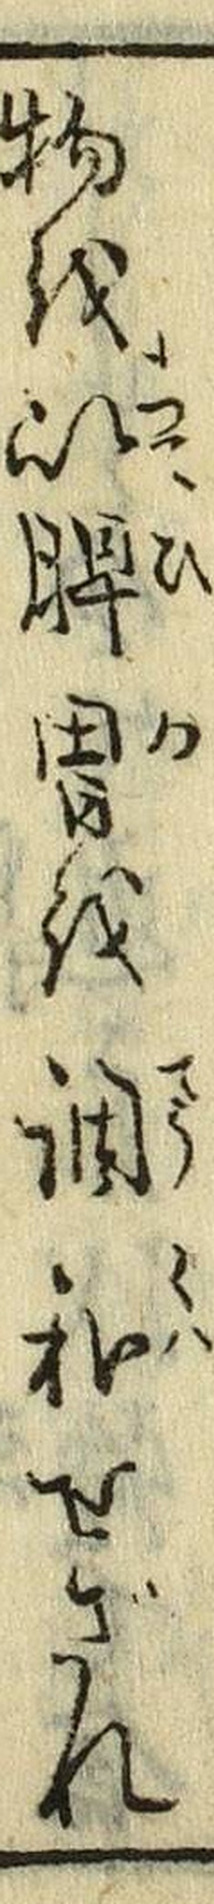物を以脾胃を調和せざれ
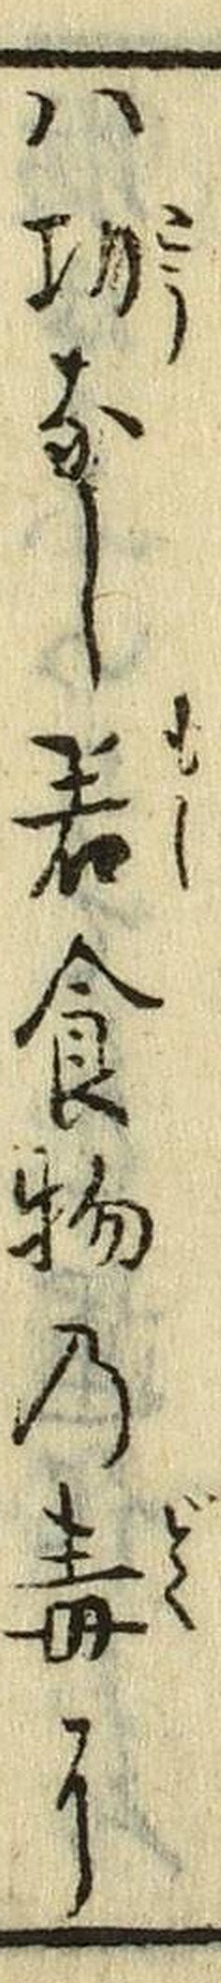は功なし若食物の毒に
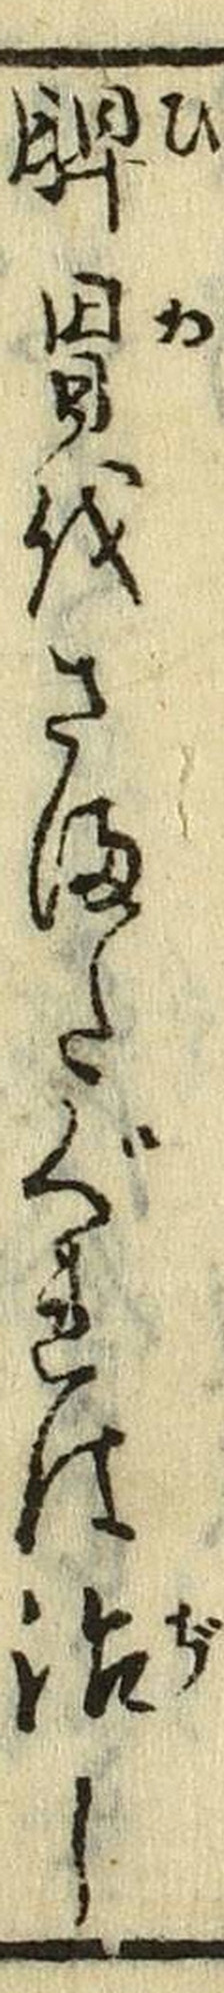脾胃をさまたぐれは治し
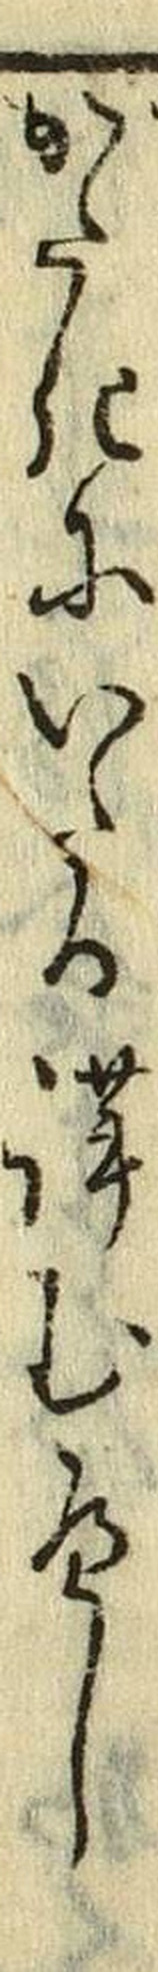がたきにいたる謹むへし
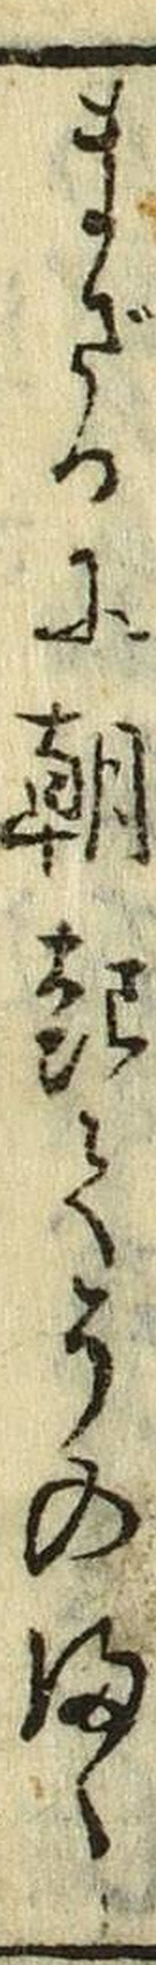まざるに朝起てそのまゝ
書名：居家養生記
